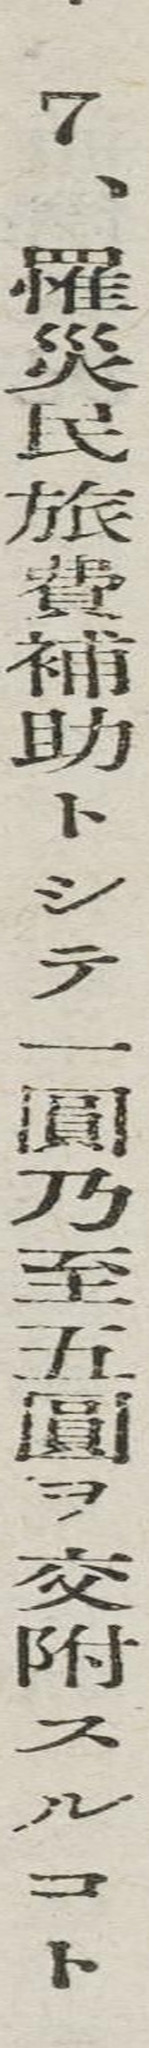７、罹災民旅費補助トシテ一円乃至五円ヲ交附スルコト
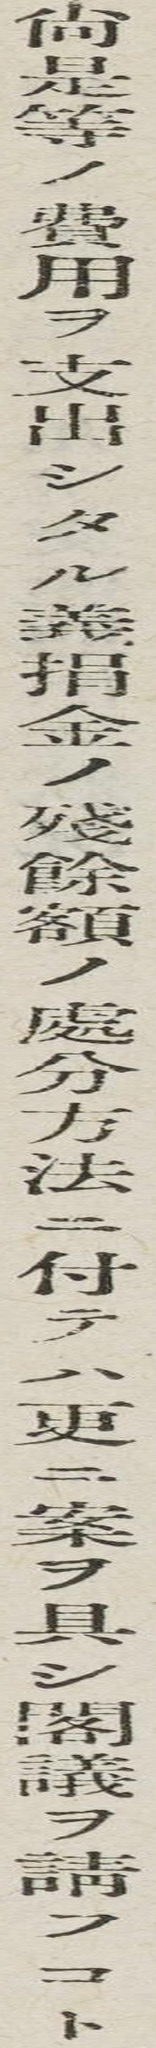尚是等ノ費用ヲ支出シタル義捐金ノ残余額ノ処分方法ニ付テハ更ニ案ヲ具シ閣議ヲ請フコト

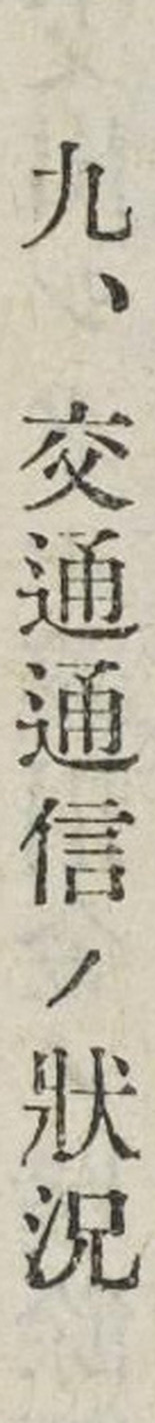九、交通通信ノ状況
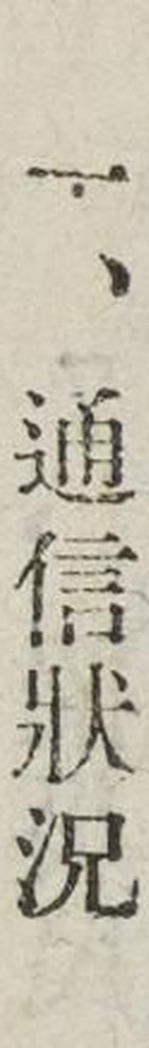一、通信状況
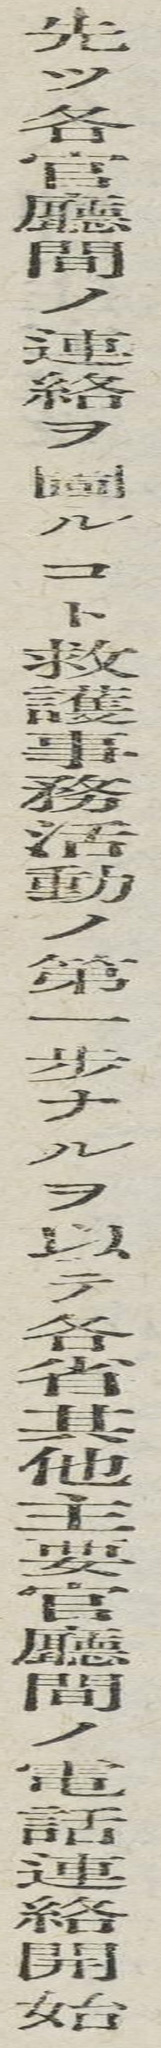先ツ各官庁間ノ連絡ヲ図ルコト救護事務活動ノ第一歩ナルヲ以テ各省其他主要官庁間ノ電話連絡開始
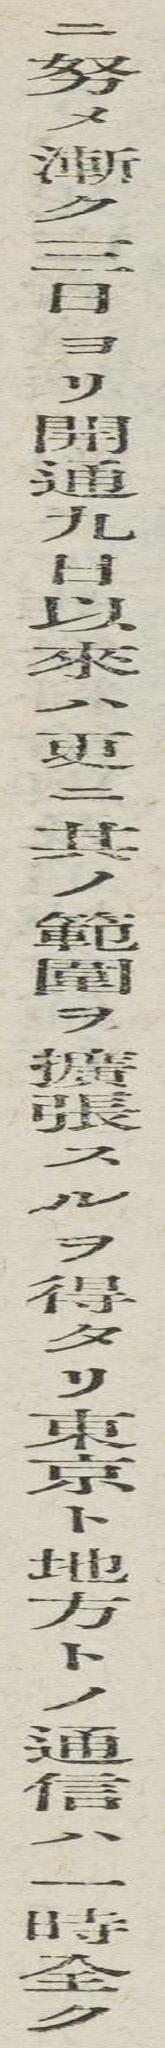ニ努メ漸ク三日ヨリ開通九日以来ハ更ニ其ノ範囲ヲ拡張スルヲ得タリ東京ト地方トノ通信ハ一時全ク
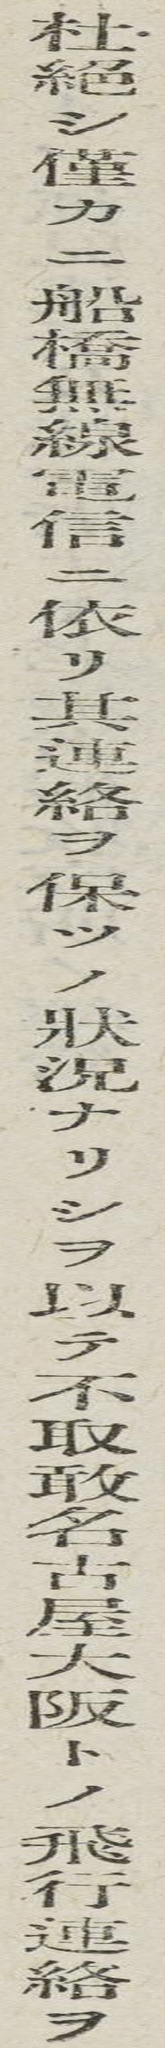杜絶シ僅カニ船橋無線電信ニ依リ其連絡ヲ保ツノ状況ナリシヲ以テ不取敢名古屋大坂トノ飛行連絡ヲ
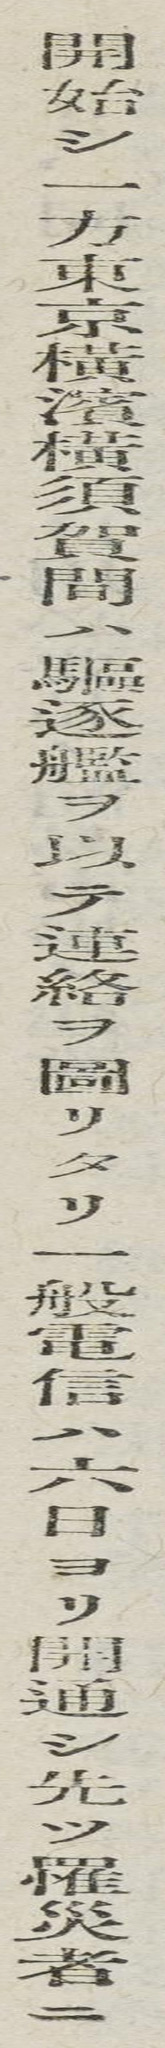開始シ一方東京横浜横須賀間ハ駆逐艦ヲ以テ連絡ヲ図リタリ一般電信ハ六日ヨリ開通シ先ツ罹災者ニ
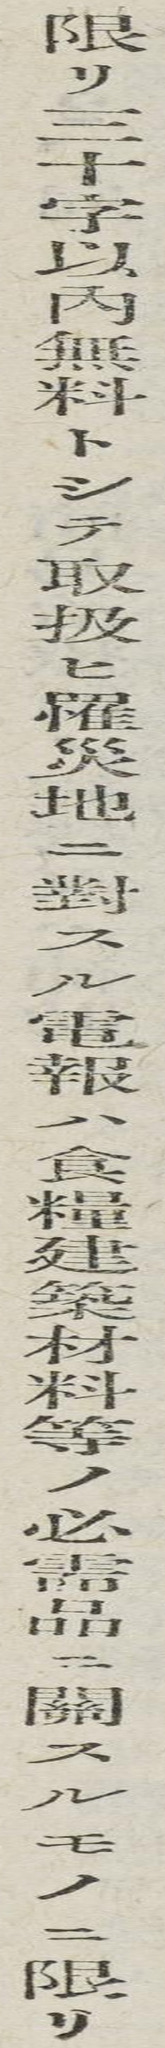限リ三十字以内無料トシテ取扱ヒ罹災地ニ対スル電報ハ食糧建築材料等ノ必需品ニ関スルモノニ限リ
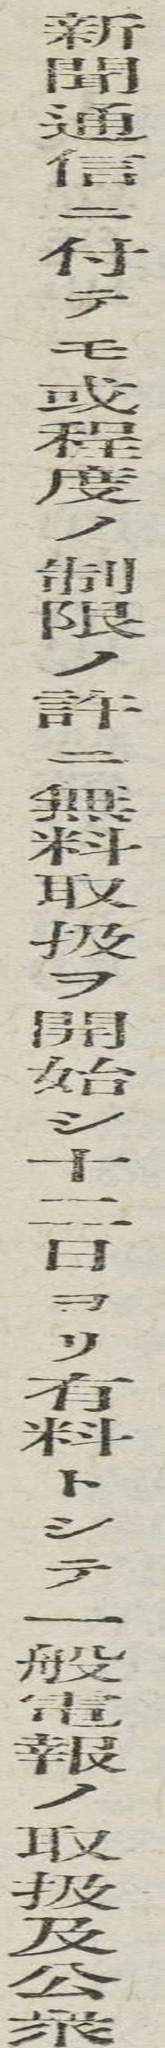新聞通信ニ付テモ或程度ノ制限ノ許ニ無料取扱ヲ開始シ十二日ヨリ有料トシテ一般電報ノ取扱及公衆
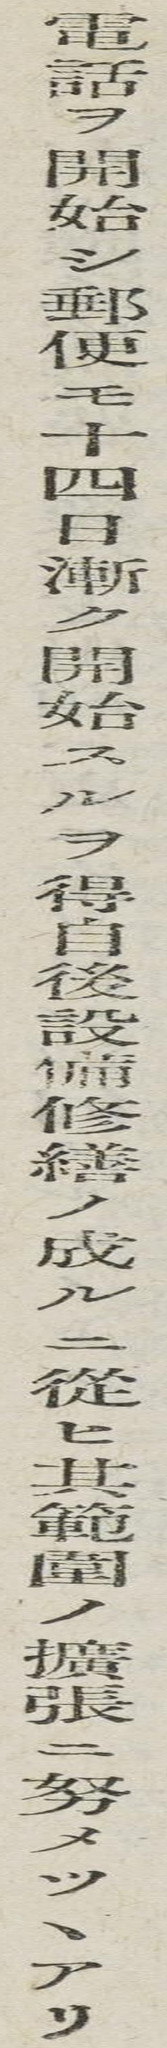電話ヲ開始シ郵便モ十四日漸ク開始スルヲ得自後設備修繕ノ成ルニ従ヒ其範囲ノ拡張ニ努メツヽアリ
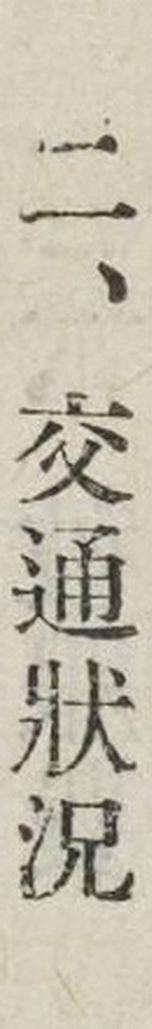ニ、交通状況
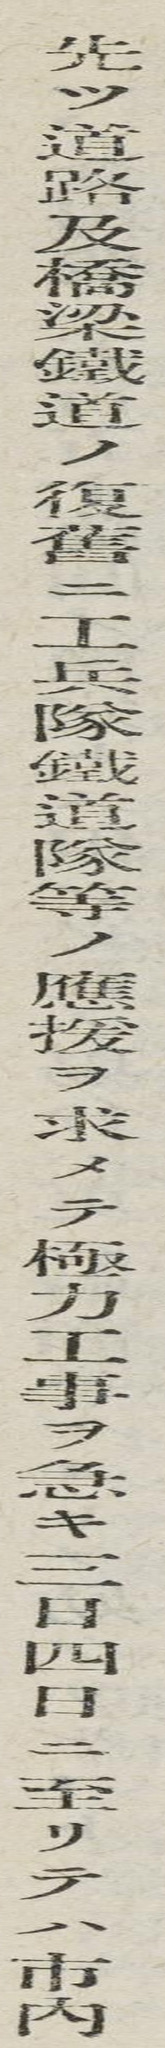先ツ道路及橋梁鉄道ノ復旧ニ工兵隊鉄道隊等ノ応援ヲ求メテ極力工事ヲ急キ三日四日ニ至リテハ市内
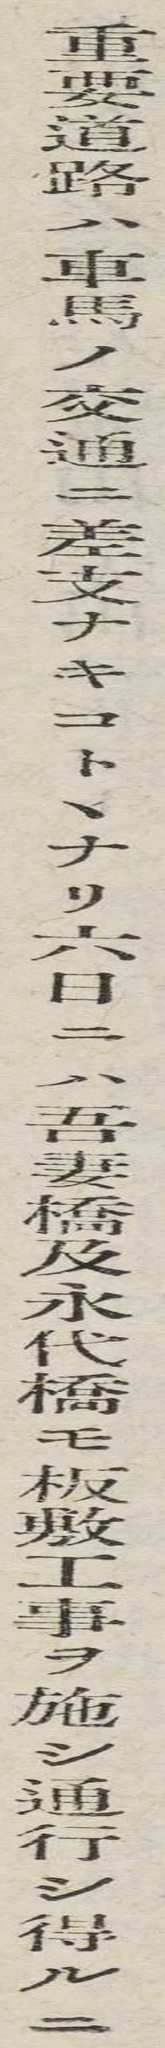重要道路ハ車馬ノ交通ニ差支ナキコトヽナリ六日ニハ吾妻橋及永代橋モ板敷工事ヲ施シ通行シ得ルニ
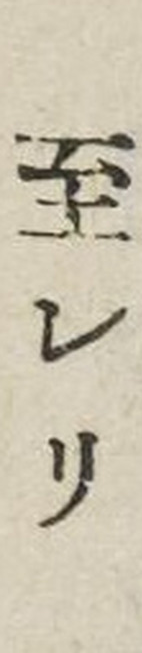至レリ
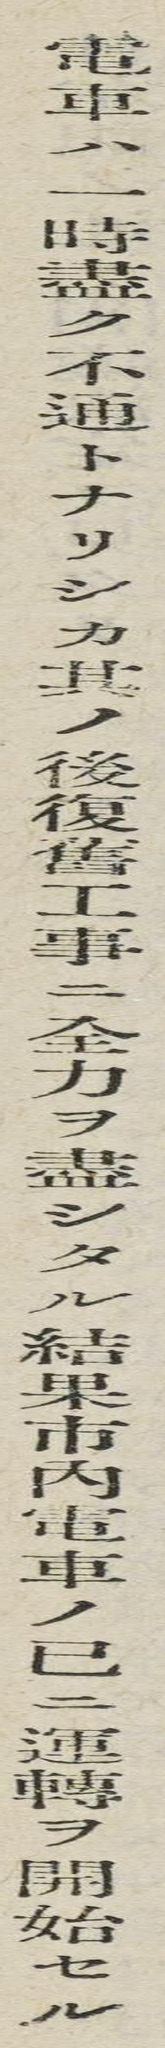電車ハ一時尽ク不通トナリシカ其ノ後復旧工事ニ全力ヲ尽シタル結果市内電車ノ已ニ運転ヲ開始セル
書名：震災被害状況並救護施設概要
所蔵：東京大学地震研究所図書室 Earthquake Research Institute Library, The University of Tokyo, JAPAN
